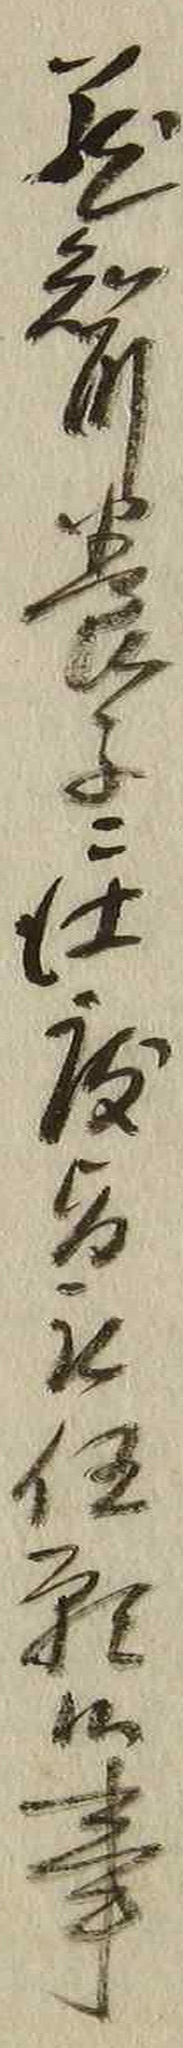蔵聟養子仕度旨被任願候事
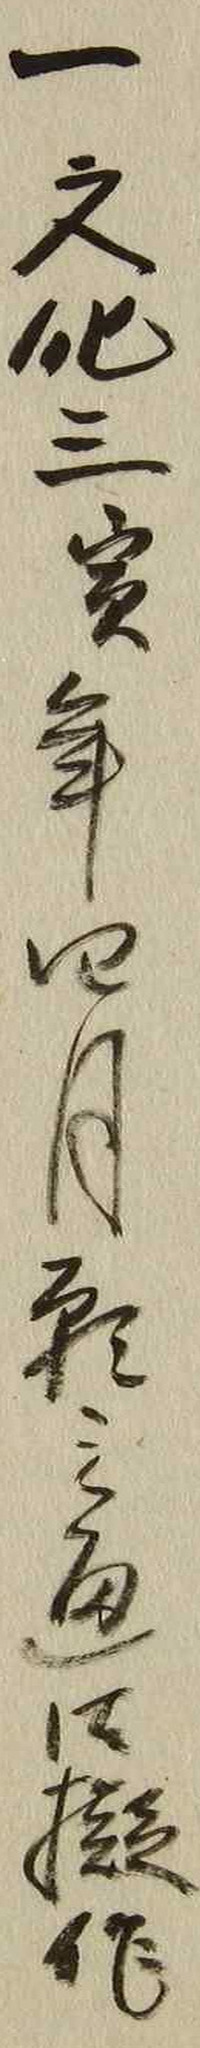一文化三寅年四月願之通御擬作
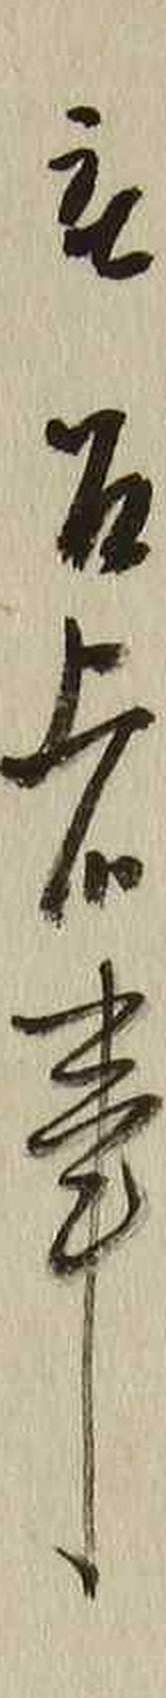被召上候事
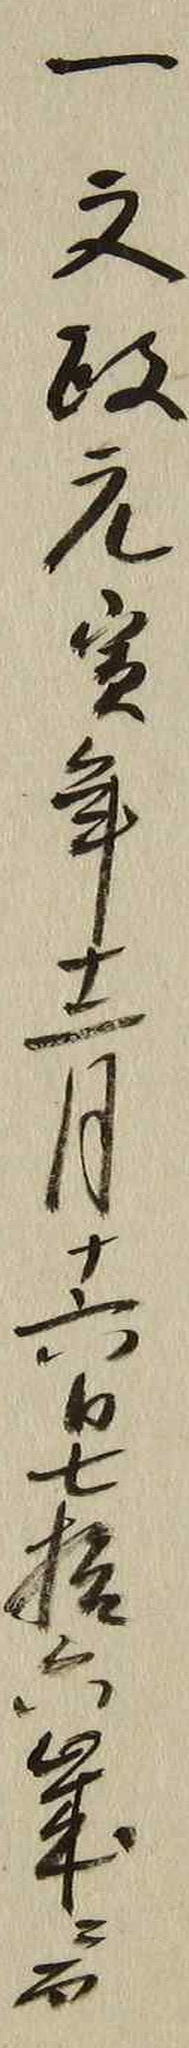一文政元寅年十二月十六日七拾六歳に而
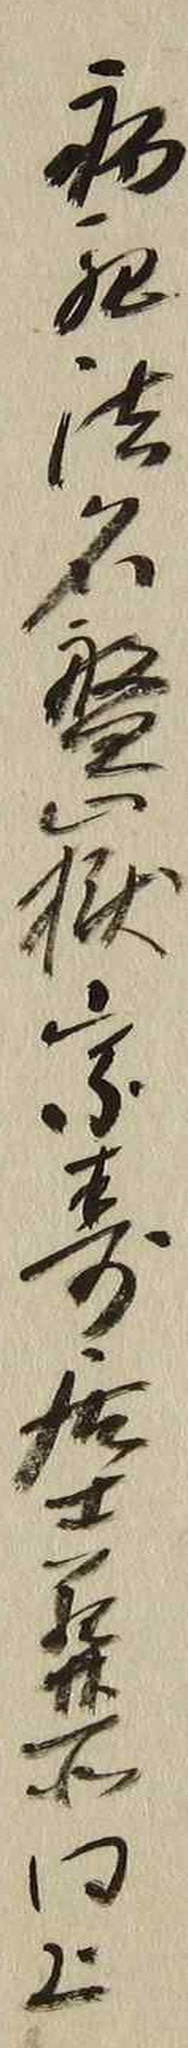病死法名盤正嶽宗寿居士葬所々上
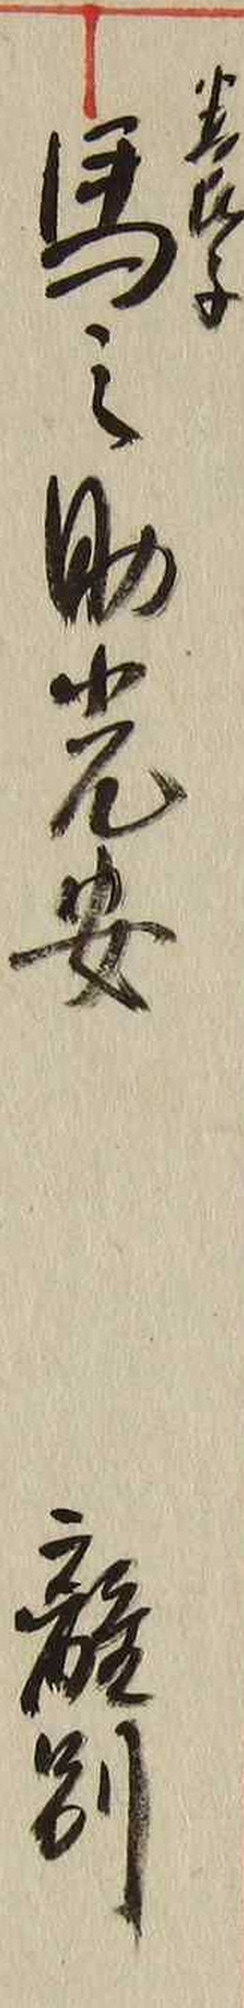馬之助光安離別
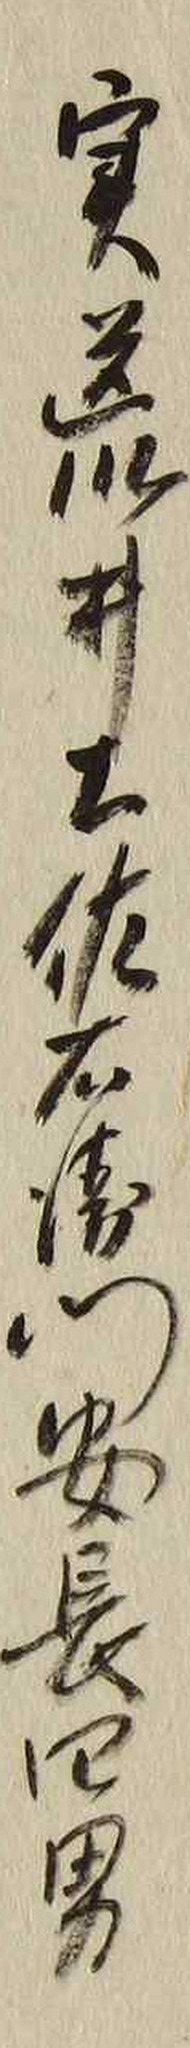実荒井土佐右衛門安長四男
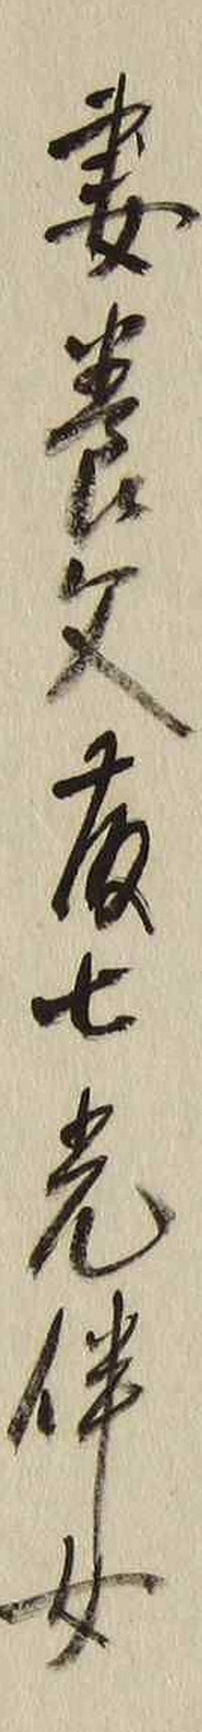妻養父藤七光伴女

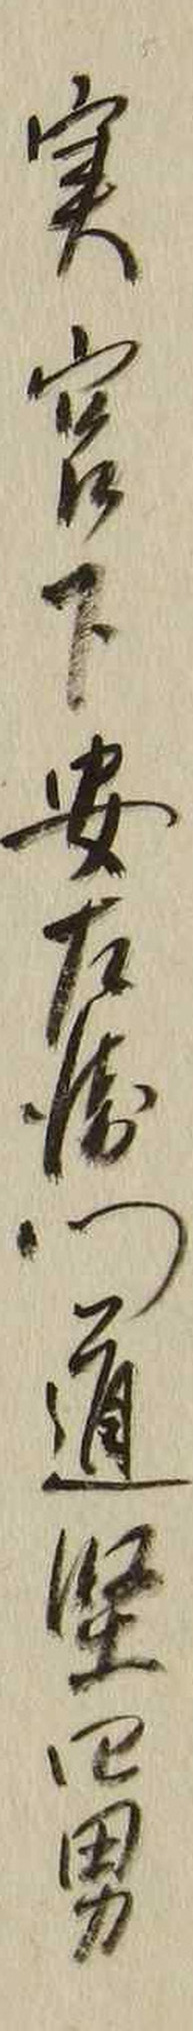実宮下安左衛門道堅四男
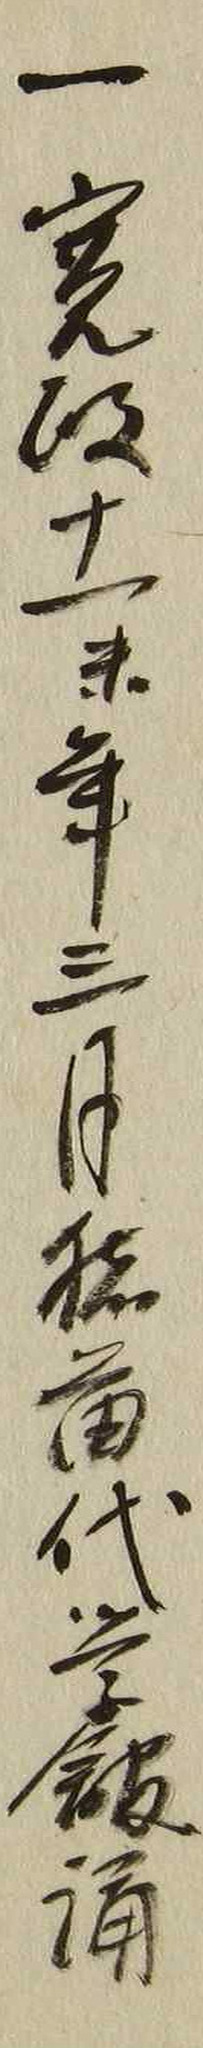一寛政十一未年三月猪苗代学館補
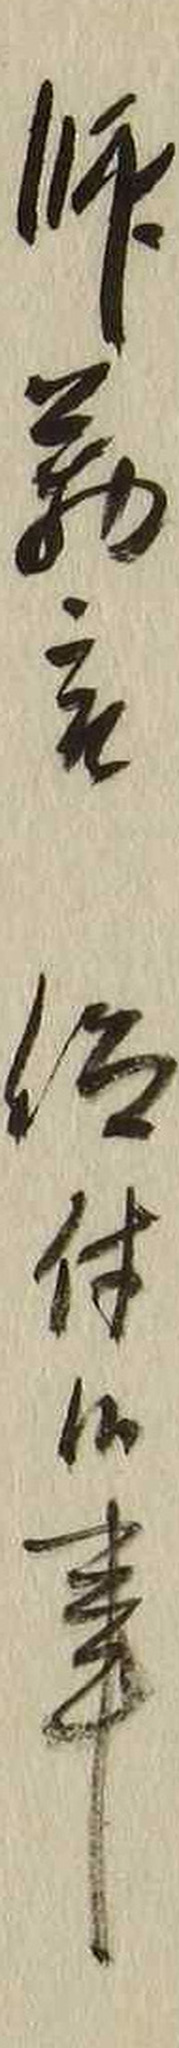師勤被仰付候事
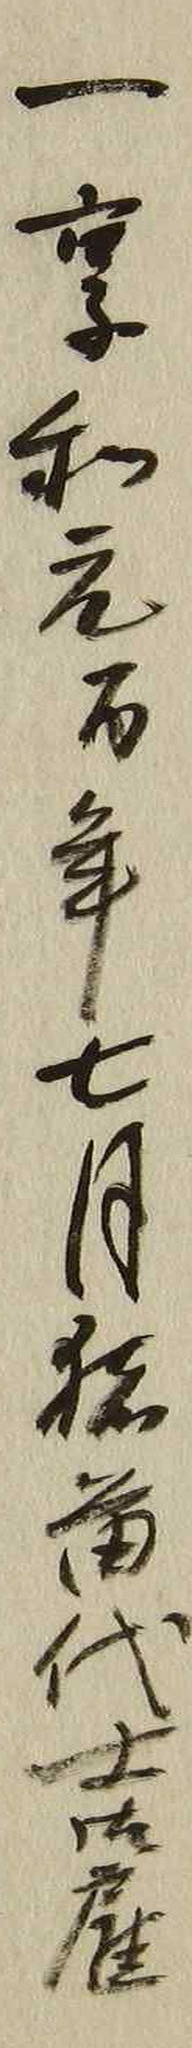一享和元酉年七月猪苗代士御雇
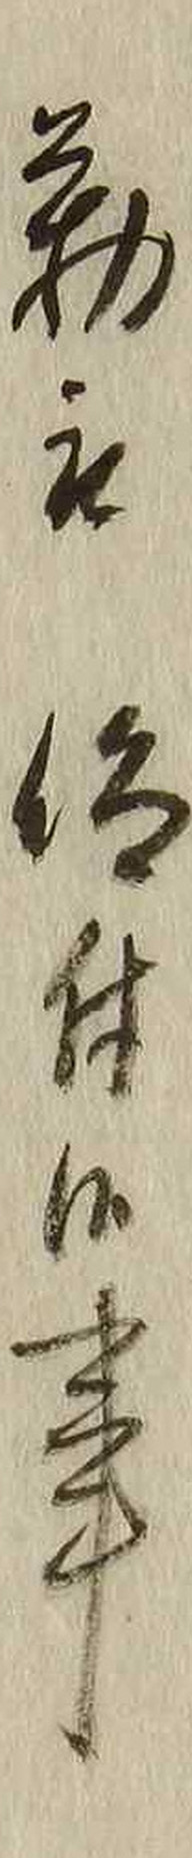勤被仰付候事
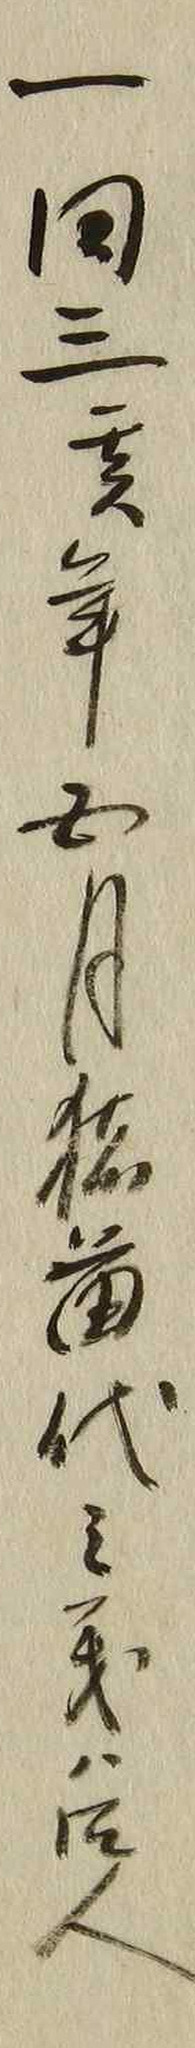一同三亥年五月猪苗代之義は御人
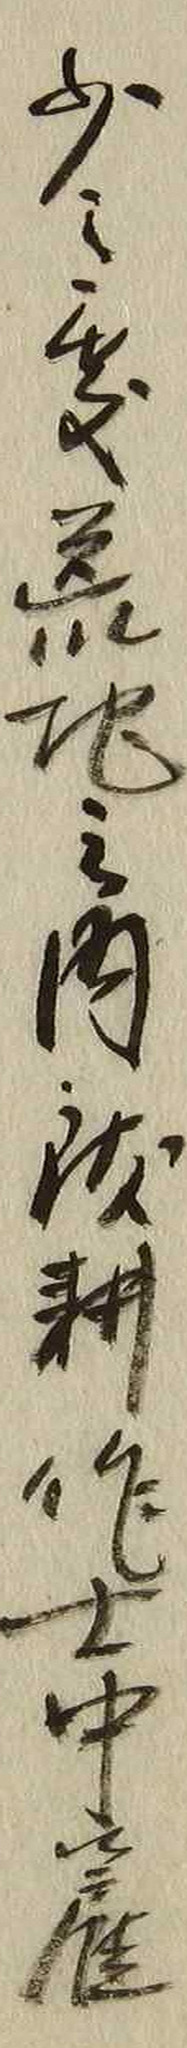少之処荒地之内致耕作候士中御雇
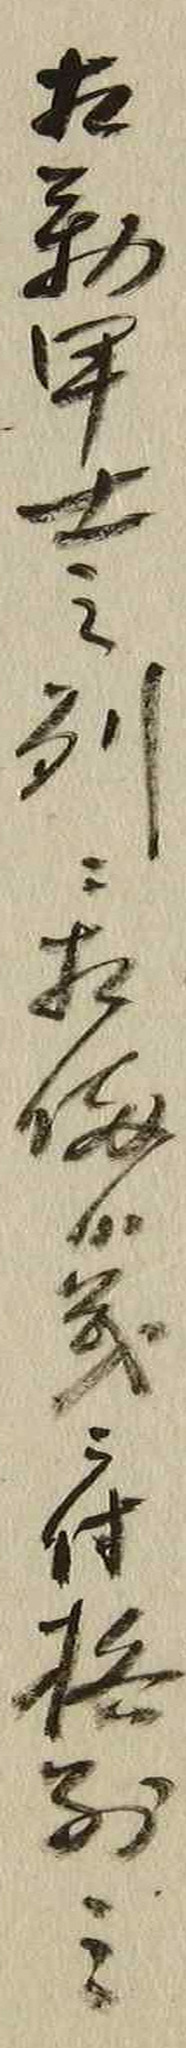相勤甲士之列に相成候義に付格別之
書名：諸士系譜　巻之360　す之部10
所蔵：会津若松市立会津図書館
